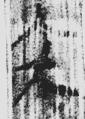內
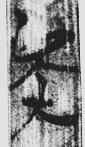矣
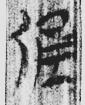俑（庸）
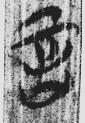言
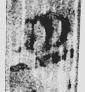之
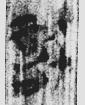信
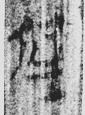俑（庸）
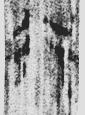行
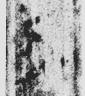之
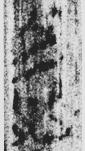敬
